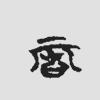晨
